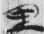里
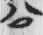公
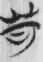苛
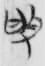受
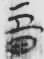○（期）
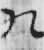九
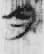月
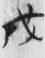戊
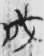戌
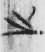之
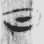日
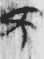不
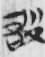○（察）
